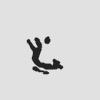水
